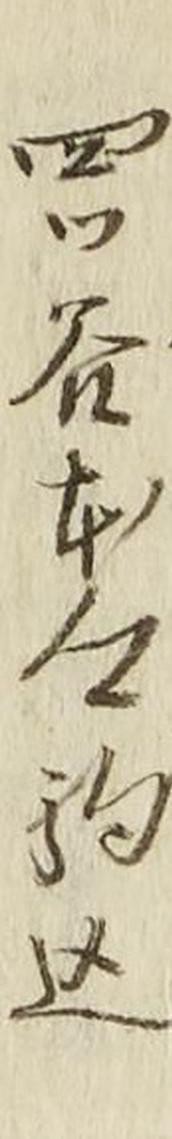四ツ谷本郷駒込
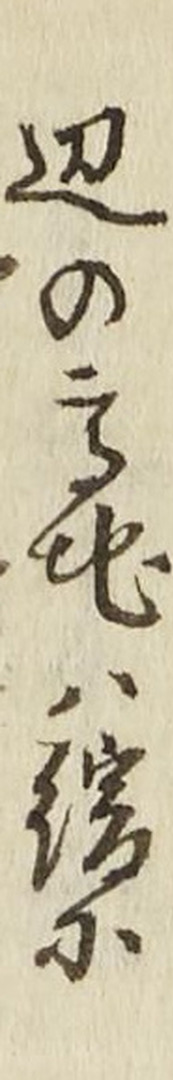辺の高地は緩に
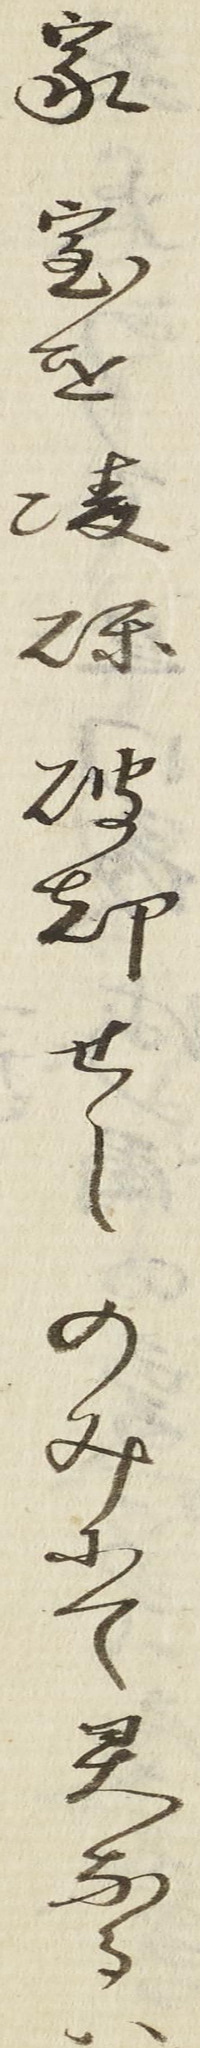家宝を凌礫破却せしのみにて異なるは
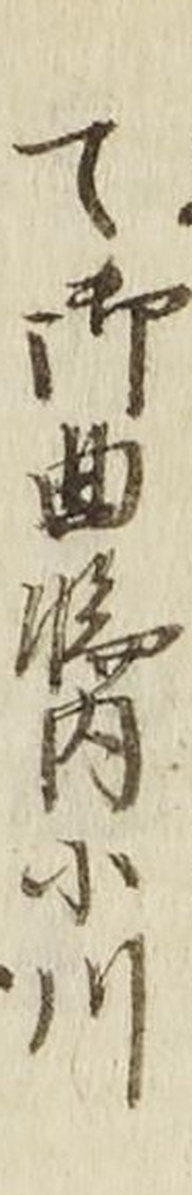て御曲輪内小川
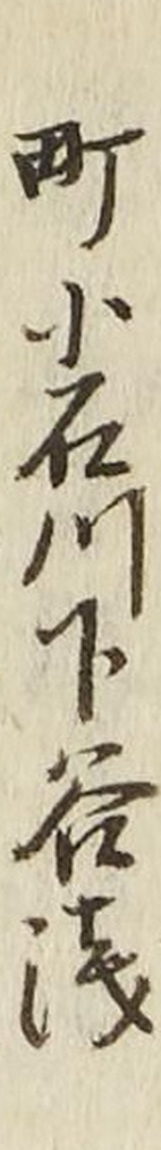町小石川下谷浅
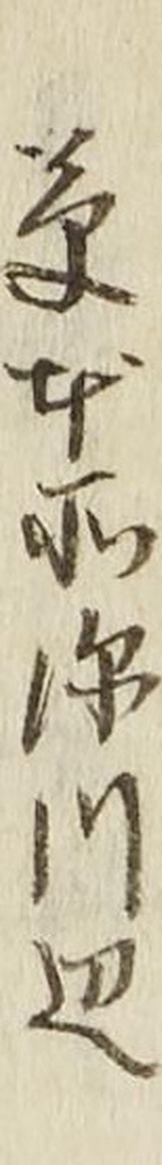草本所深川辺
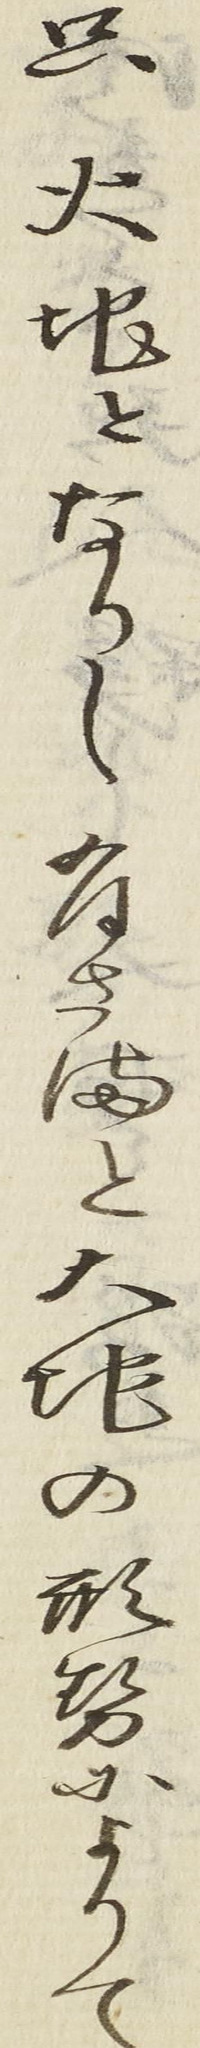只火地となりし有さまと大地の形勢によりて
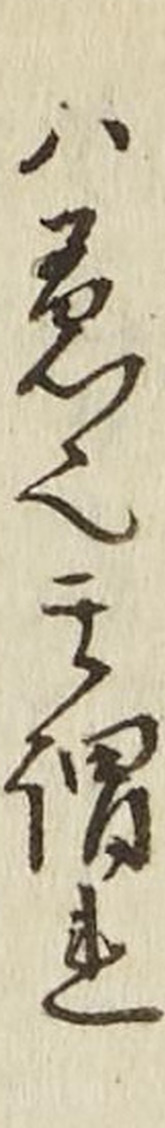は急也其謂れ
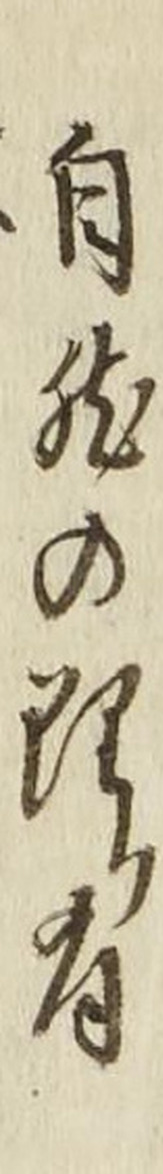自然の理り有
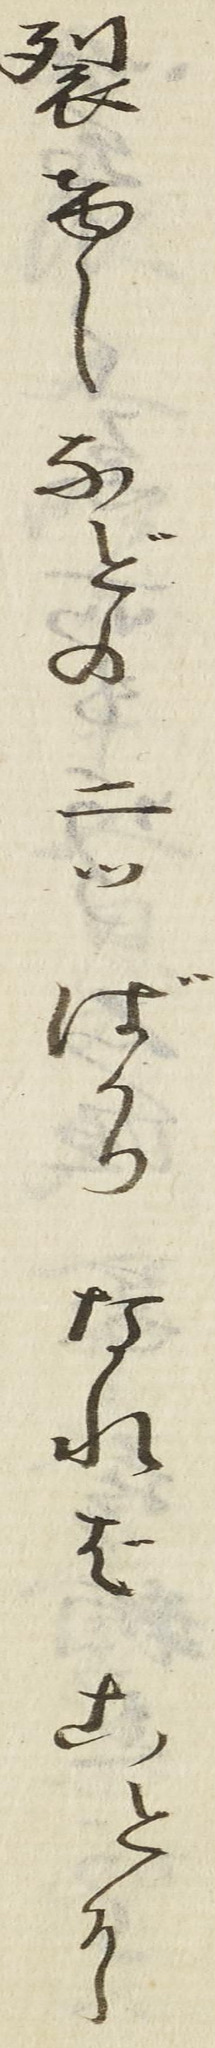裂けしなどの二ツばかりなればことに
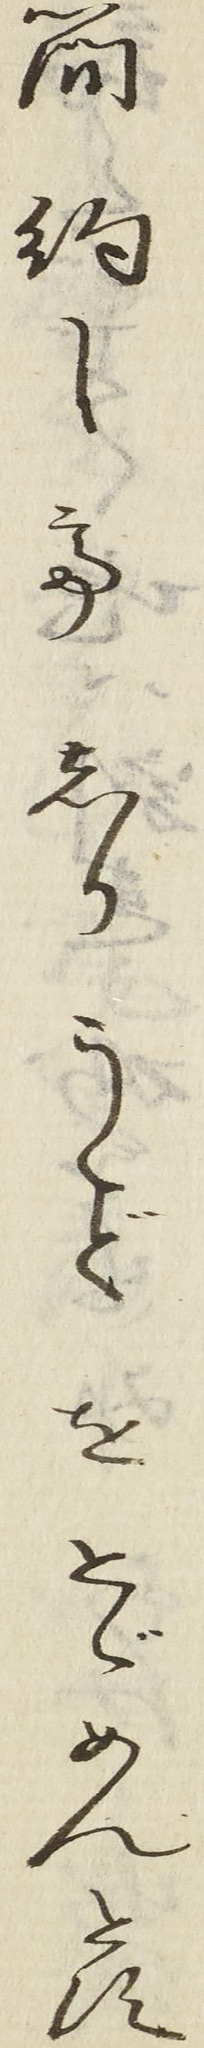簡約してしりうこどをとゞめんとす
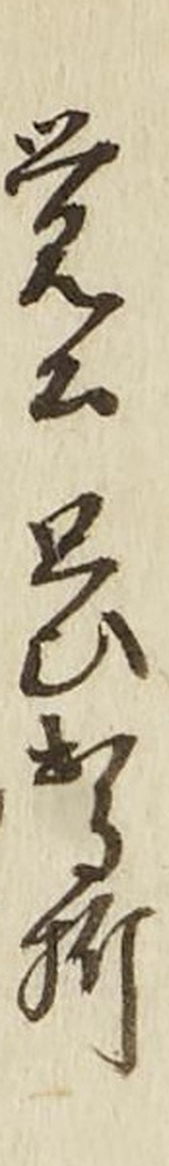覚云思ひ出る折
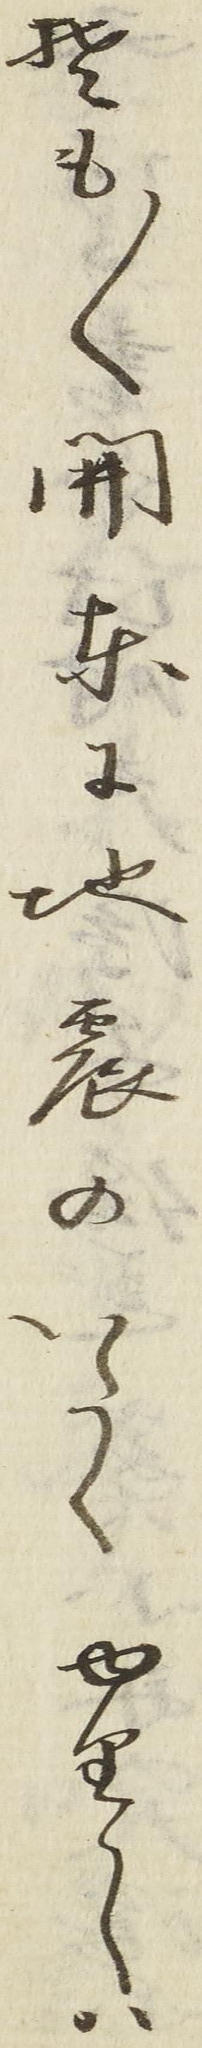そも〳〵開東に地震のいたくゆりしは
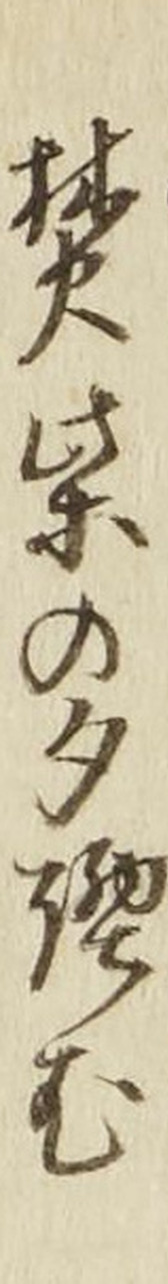焚柴の夕煙む
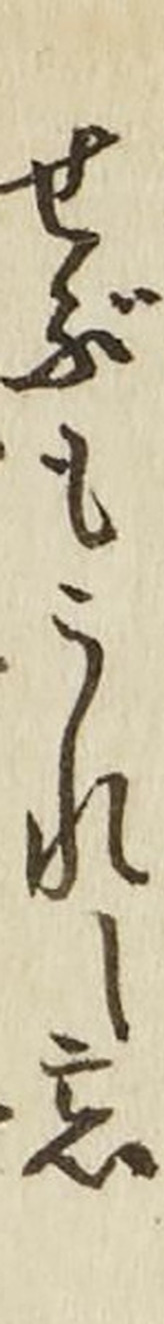せぶもうれし忘
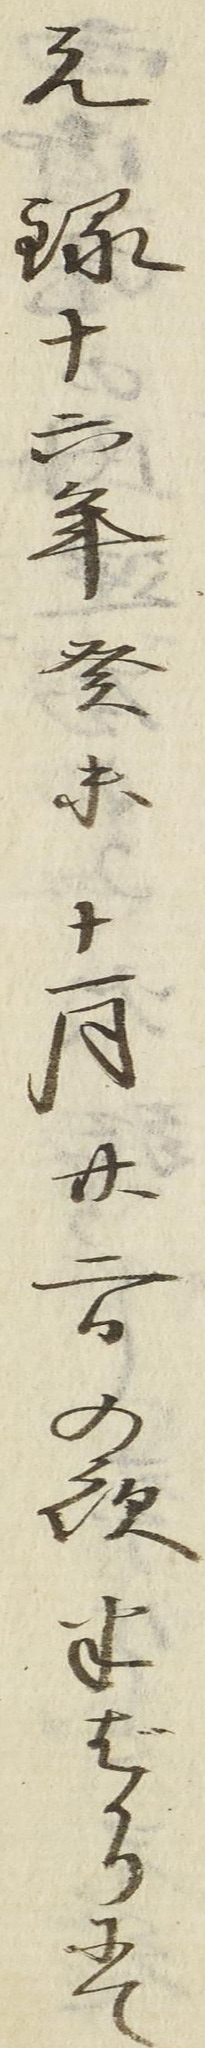元録十六年癸未十一月廿ニ日の夜半ばかりにて
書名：やぶれ窓の記　全
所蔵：東京大学地震研究所図書室 Earthquake Research Institute Library, The University of Tokyo, JAPAN
